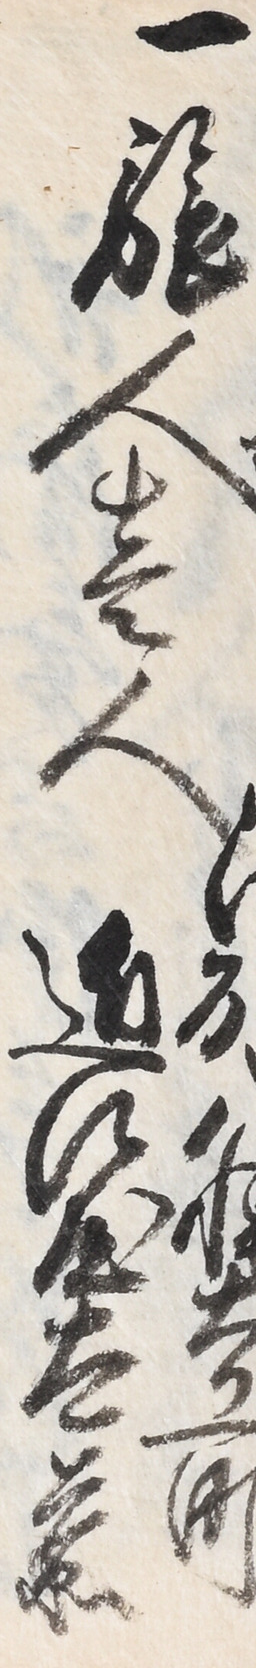一旅人壱人油屋吉兵衛
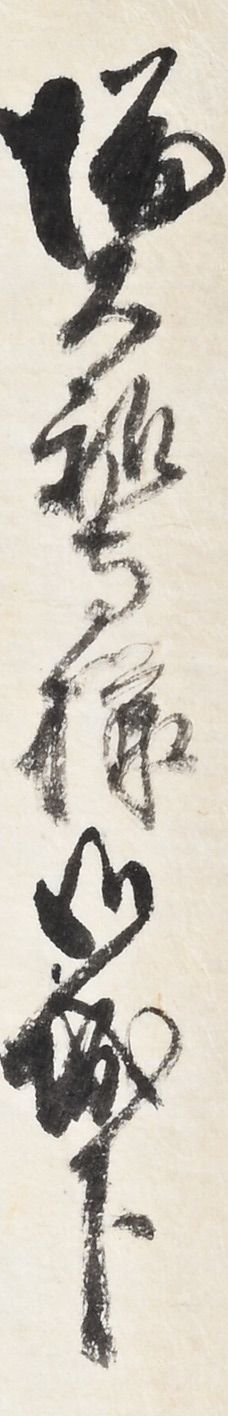堀大和守様御城下
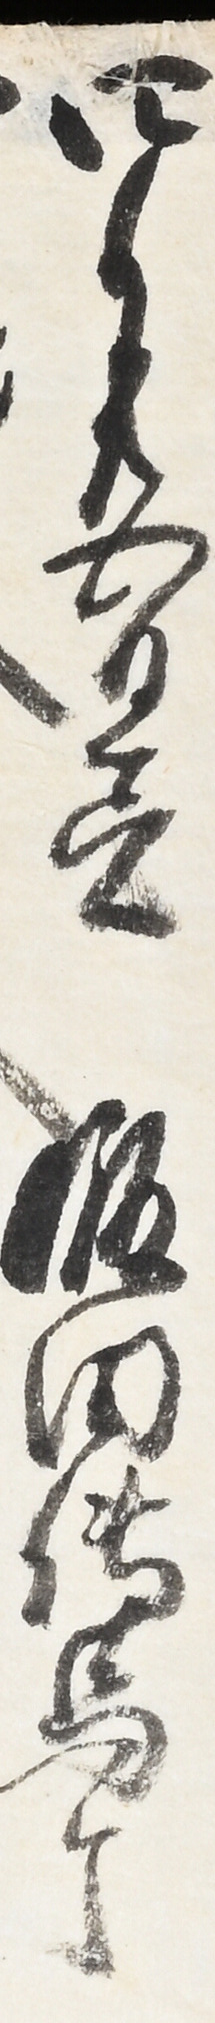四月廿五日着飯田伝馬丁
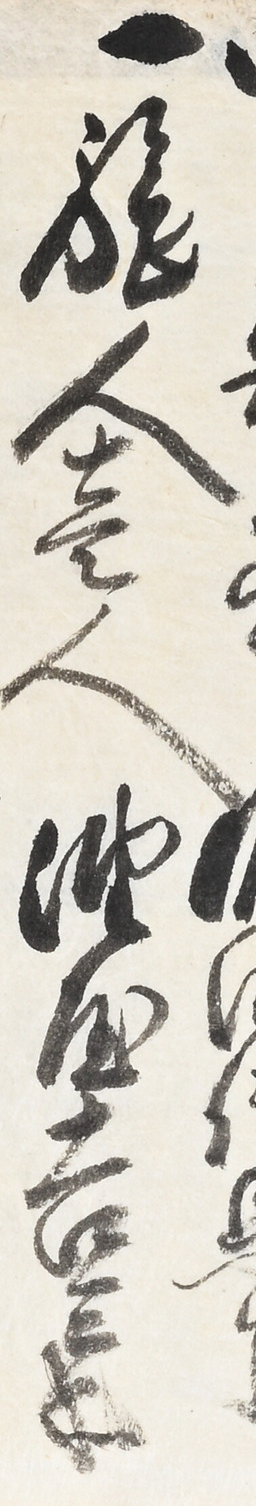一旅人壱人油屋吉兵衛
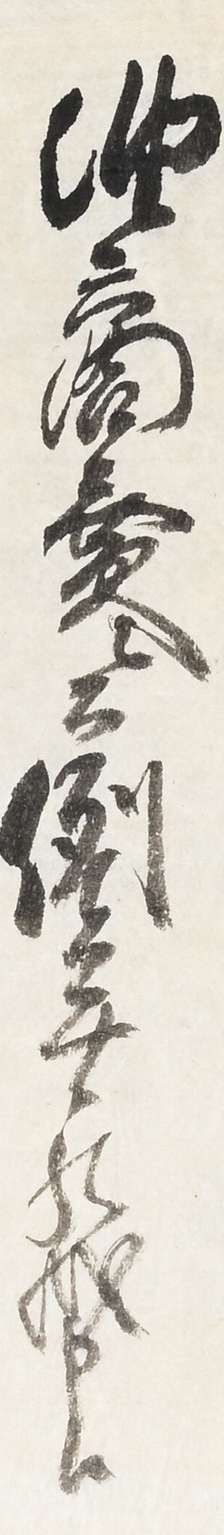油商売ニ而例年罷越申候
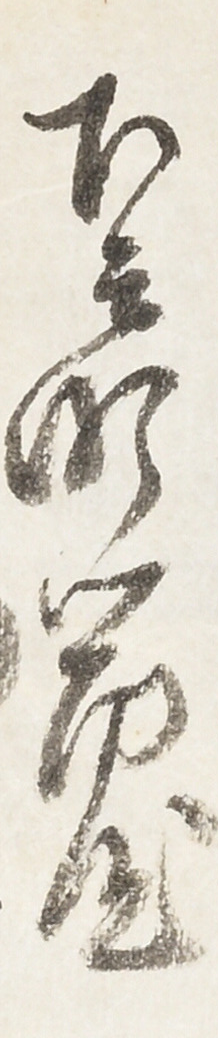下モ町冨屋
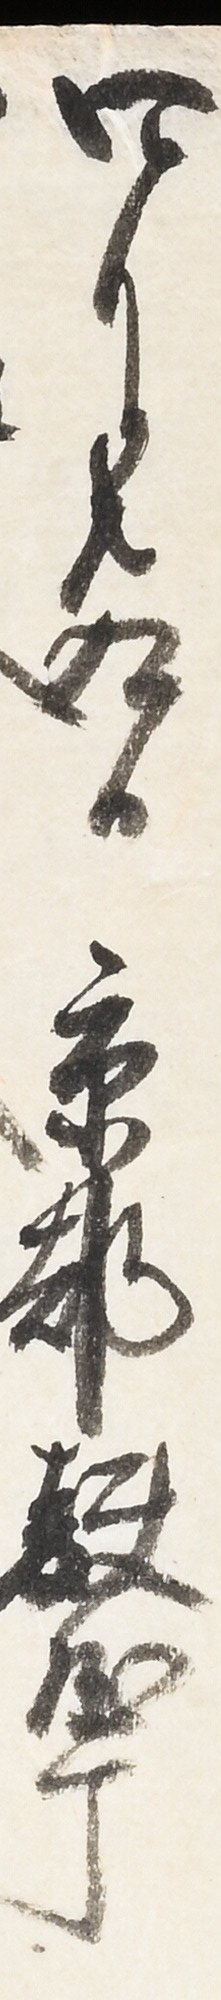四月廿九日京都麩屋丁
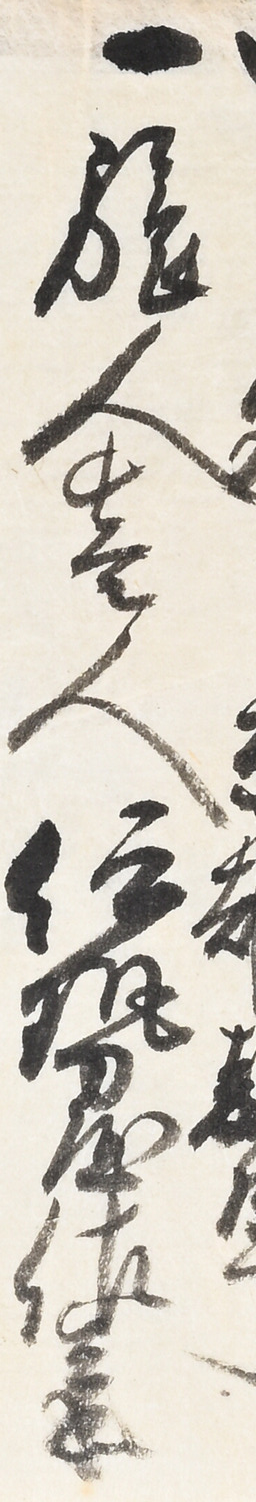一旅人壱人伊勢屋佐兵衛
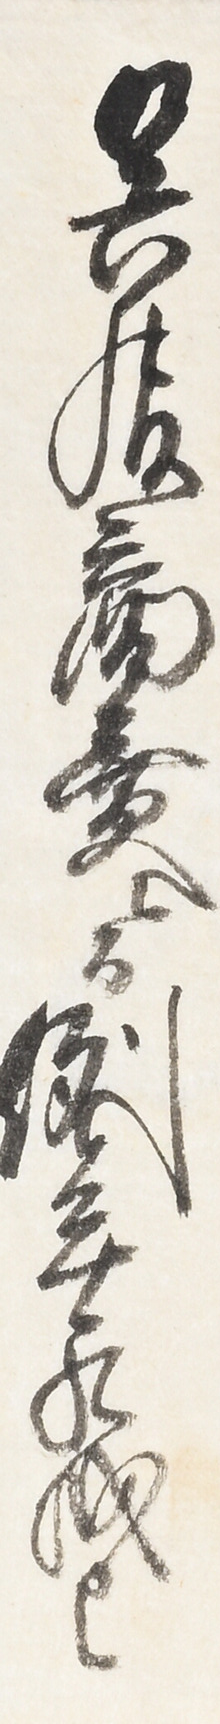呉服商売ニ而例年罷越申候
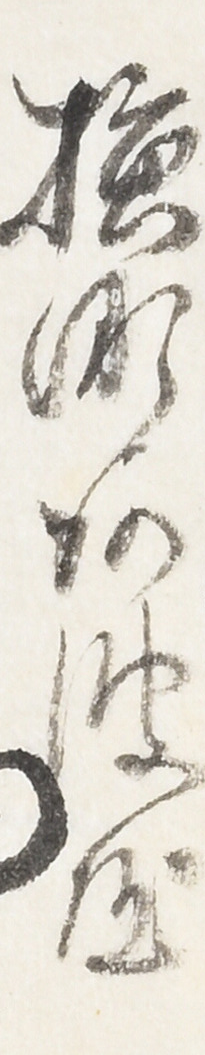横町阿波屋
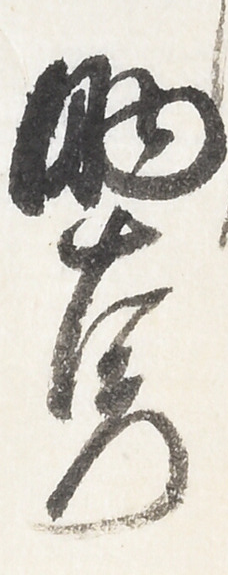助右衛門
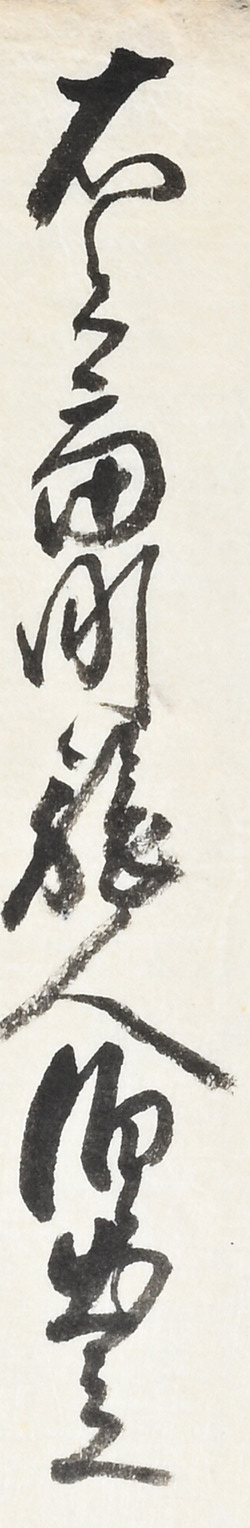右者当町旅人泊出立
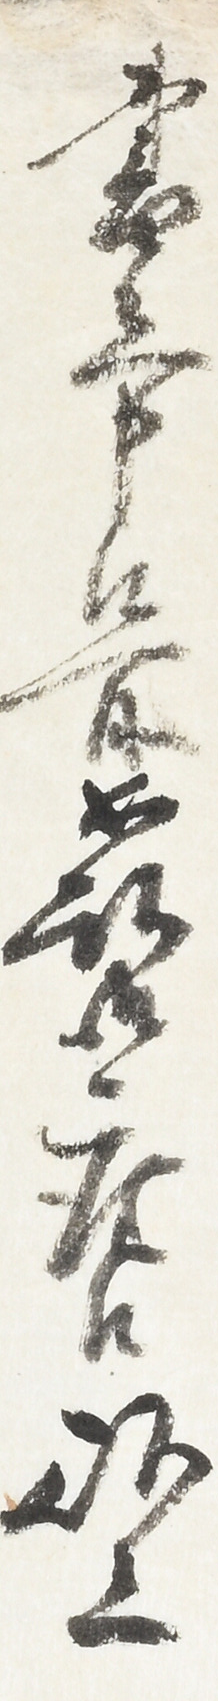書上申候所如斯御座候以上
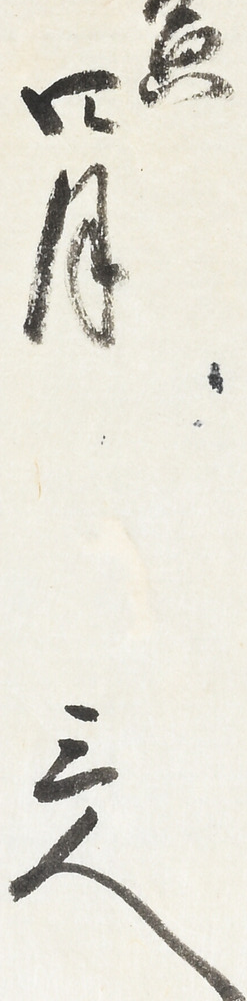四月三人

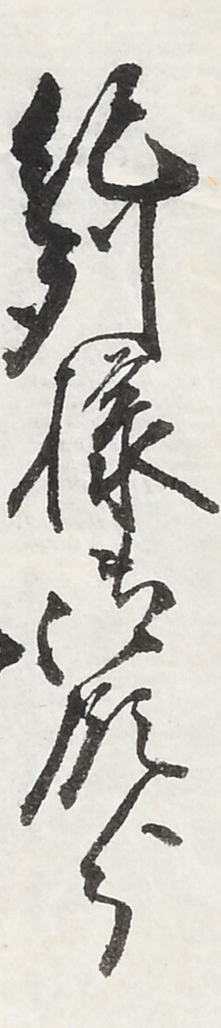紀州様御領分
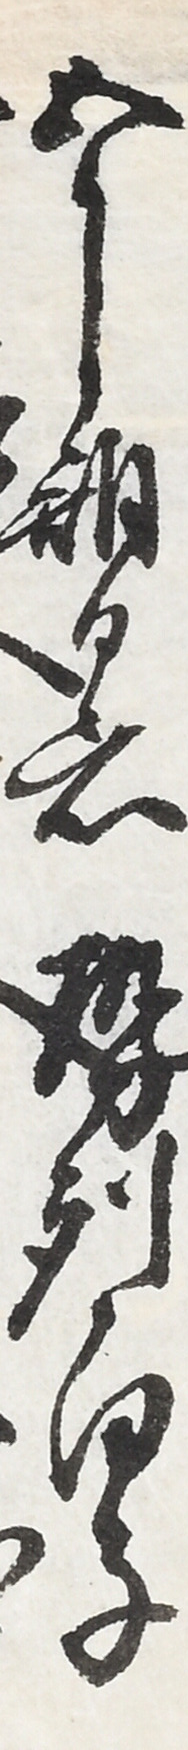五月朔日着勢州白子
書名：旅人泊控帳
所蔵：伊那市立高遠町図書館・合同会社AMANE
